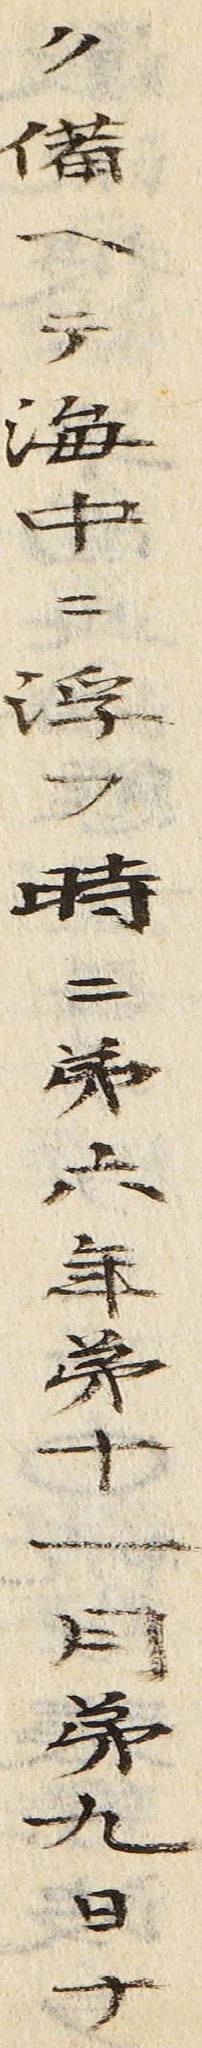ク備ヘテ海中ニ浮フ時ニ第六年第十一月第九日ナ
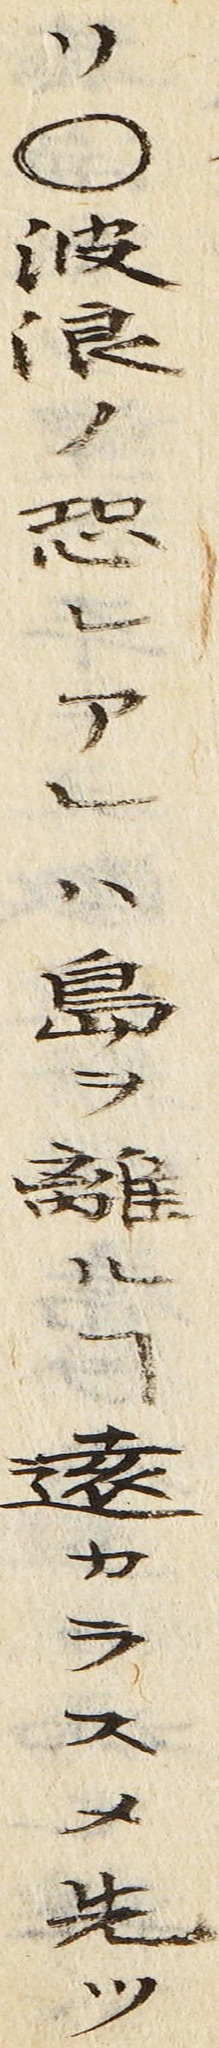リ◯波浪ノ恐レアレハ島ヲ離ルコト遠カラスシテ先ツ
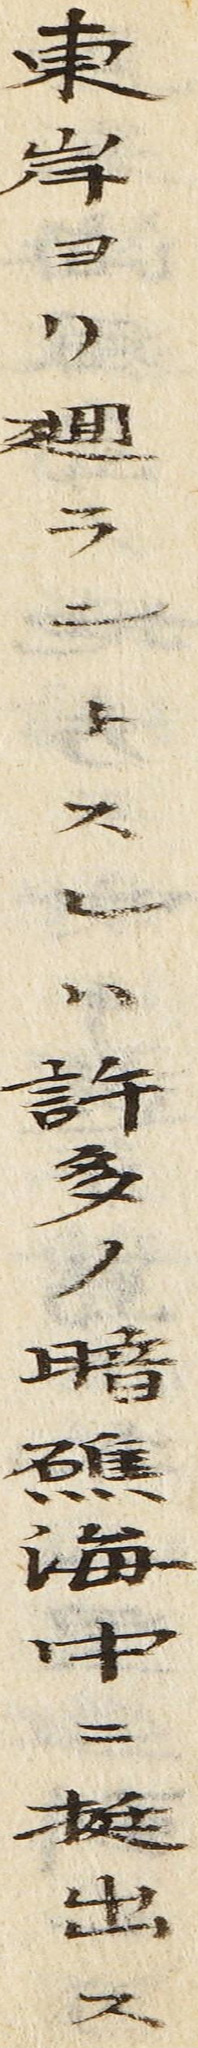東岸ヨリ廻ラントスレハ許多ノ暗礁海中ニ挺出ス
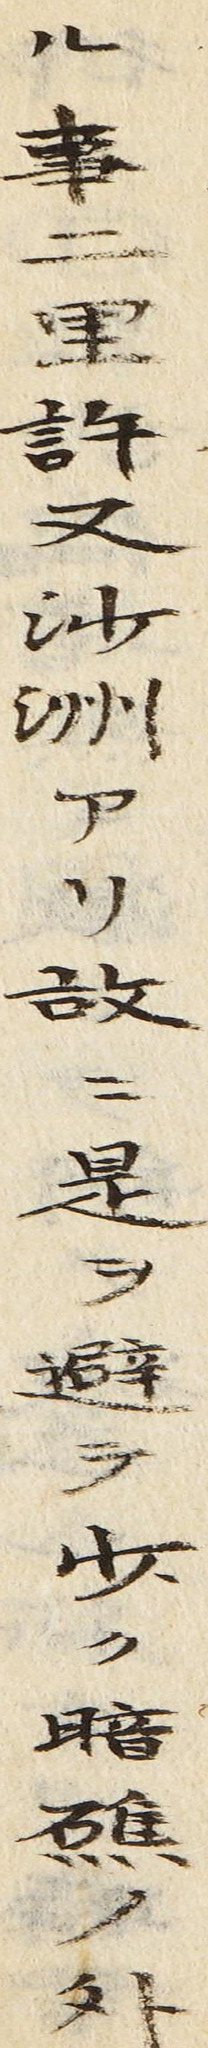ル事二里許又沙洲アリ故ニ是ヲ避テ少々暗礁ノ外
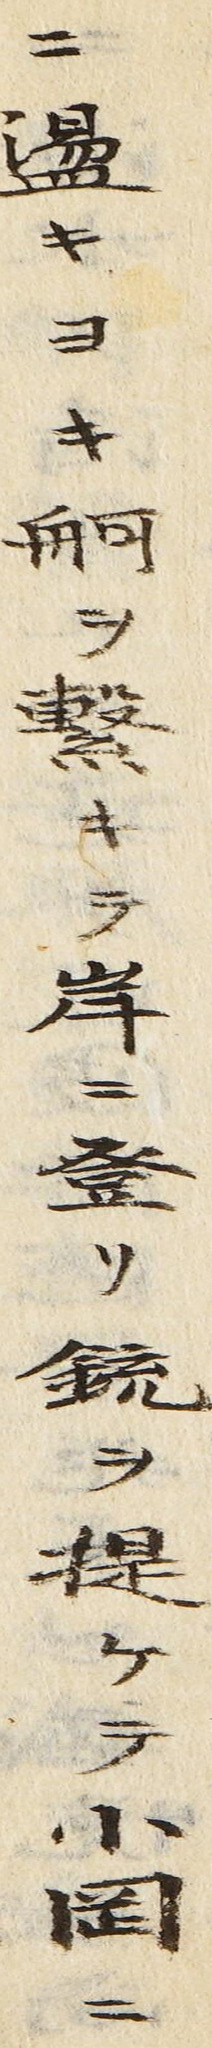ニ盪キヨキ舸ヲ繋キテ岸ニ登リ銃ヲ提ケテ小岡ニ
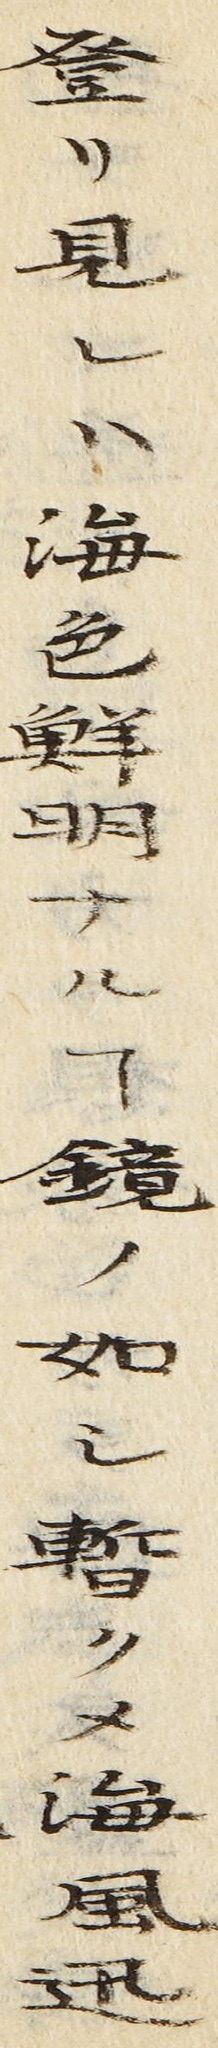登リ見レハ海色鮮明ナルコト鏡ノ如暫クシテ海風迅
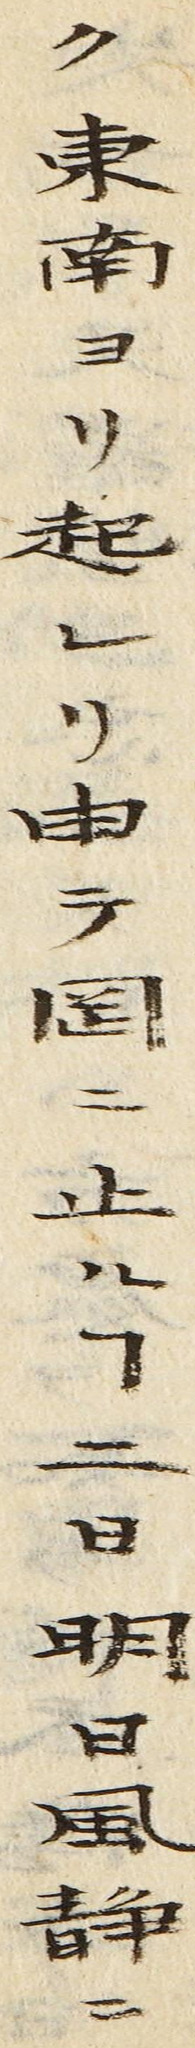ク東南ヨリ起レリ由テ岡ニ止ルコト二日明日風静ニ
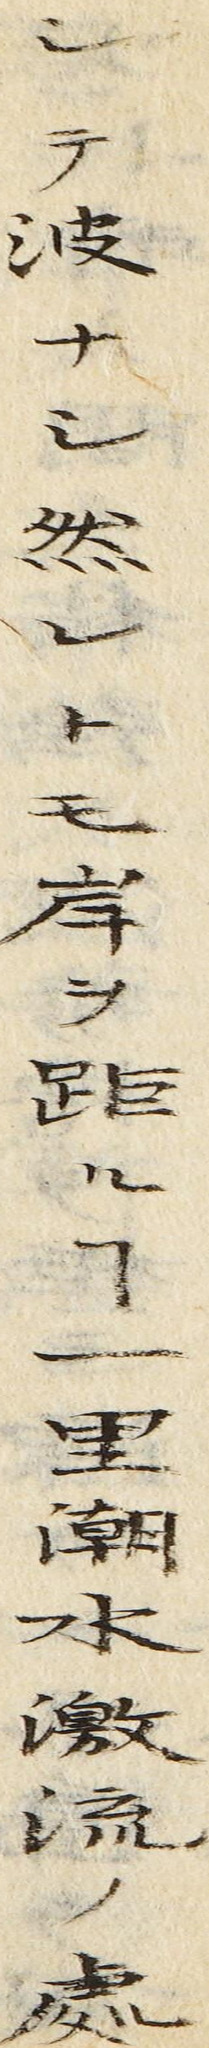シテ波ナシ然レトモ岸ヲ距ルコト一里潮水激流ノ処
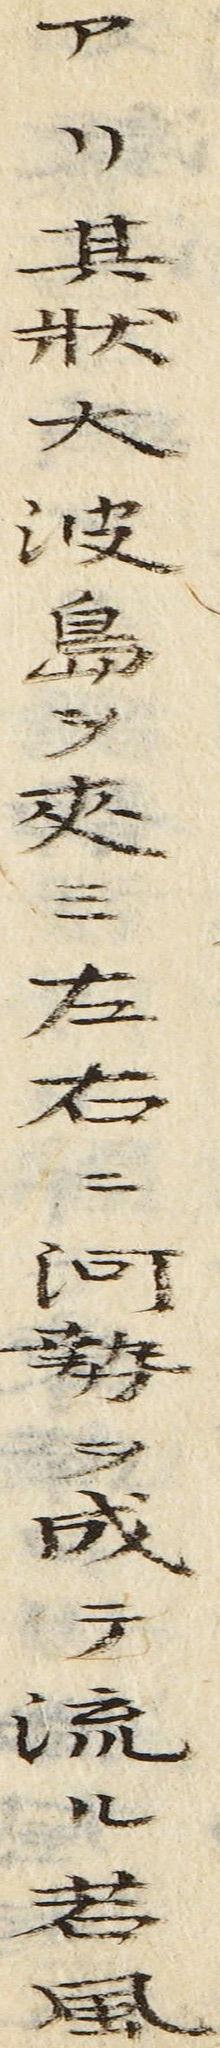アリ其状大波島ヲ夾ミ左右ニ河勢ヲ成テ流ル若風
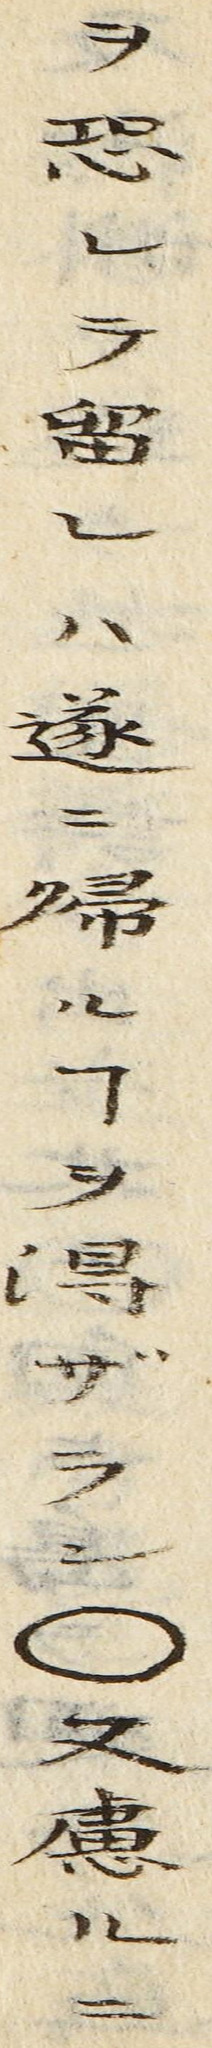ヲ恐レテ留レハ遂ニ帰ルコトヲ得ザラン◯又慮ルニ
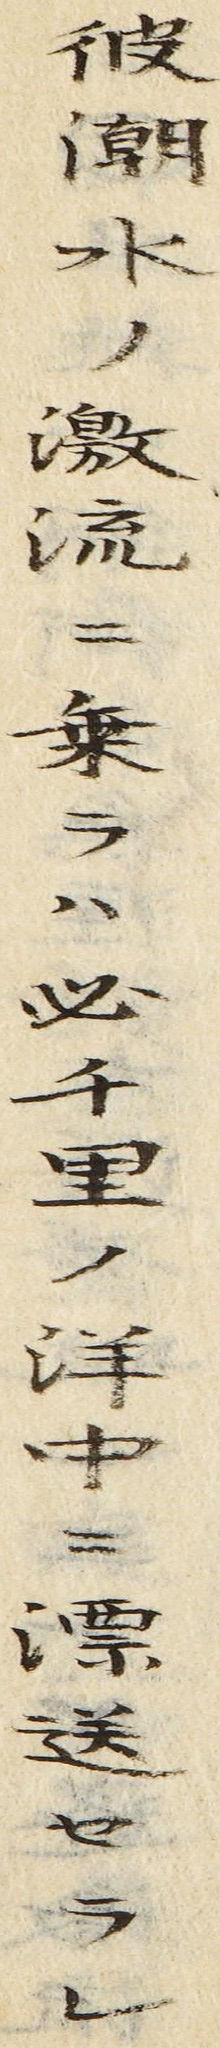波潮水ノ激流ニ乗ラハ必千里ノ洋中ニ漂送セラレ

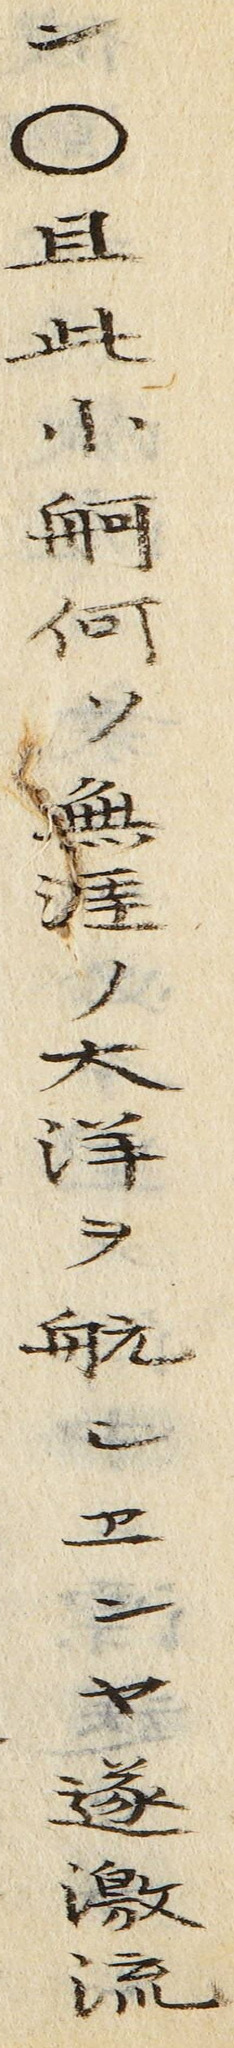ン◯且此小舸何ソ無涯ノ大洋ヲ航シヱンヤ遂激流
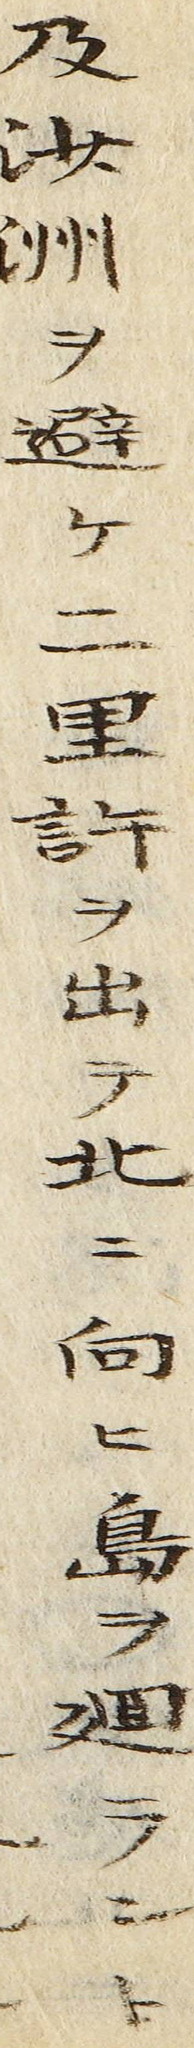及沙洲ヲ避ケ二里許ヲ出テ北ニ向ヒ島ヲ廻ラント
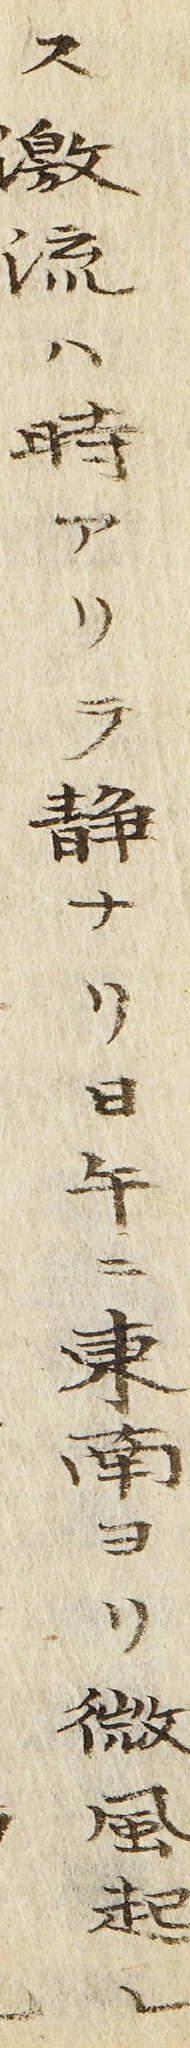ス激流ハ時アリテ静ナリ日午ニ東南ヨリ微風起レ
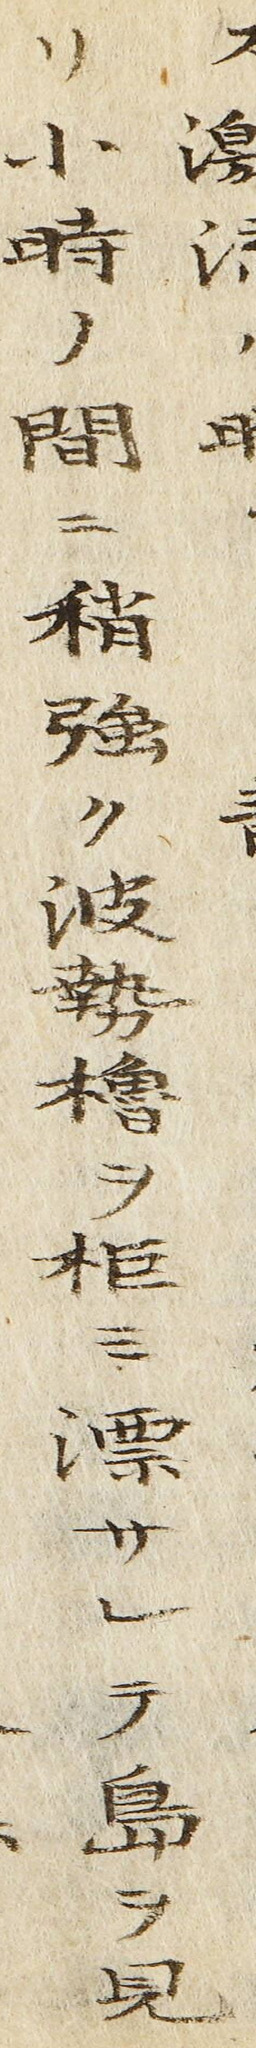リ小時ノ間ニ稍強ク波勢櫓ヲ柜ミ漂サレテ島ヲ見
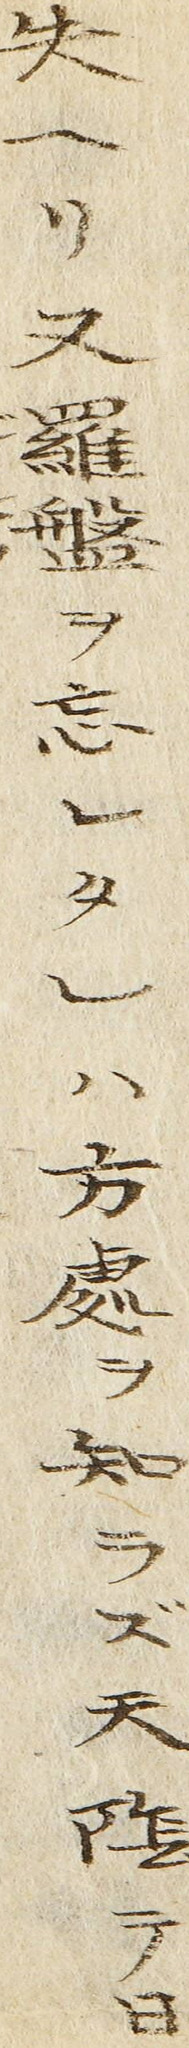失ヘリ又羅盤ヲ忘レタレハ方処ヲ知ラズ天陰テ日
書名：漂流紀事
